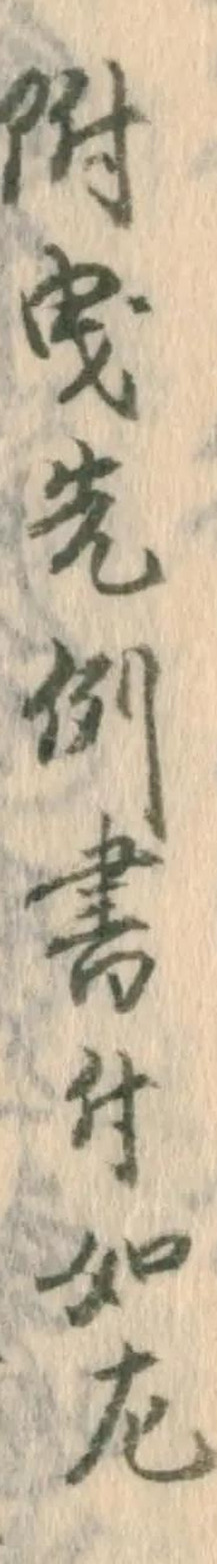附曳先例書付如左
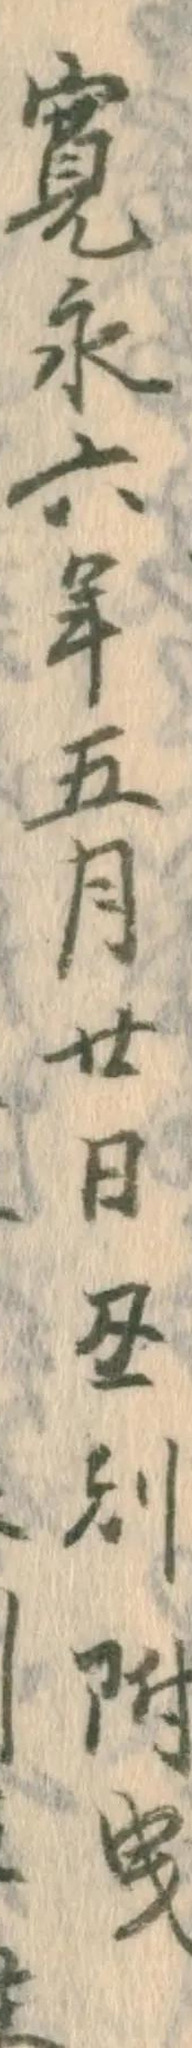寛永六年五月廿日丑刻附曳
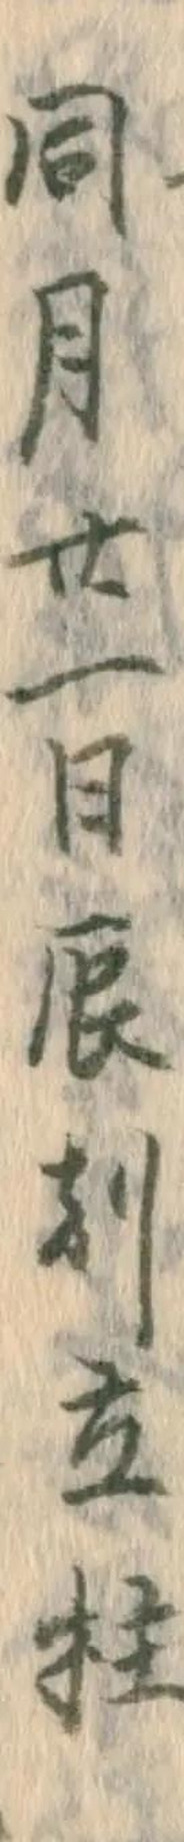同月廿一日辰刻立柱
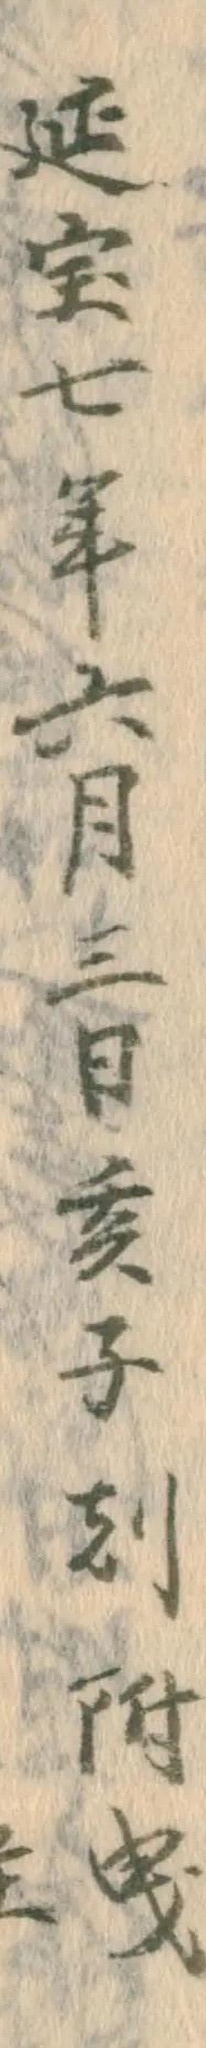延宝七年六月三日亥子刻附曳
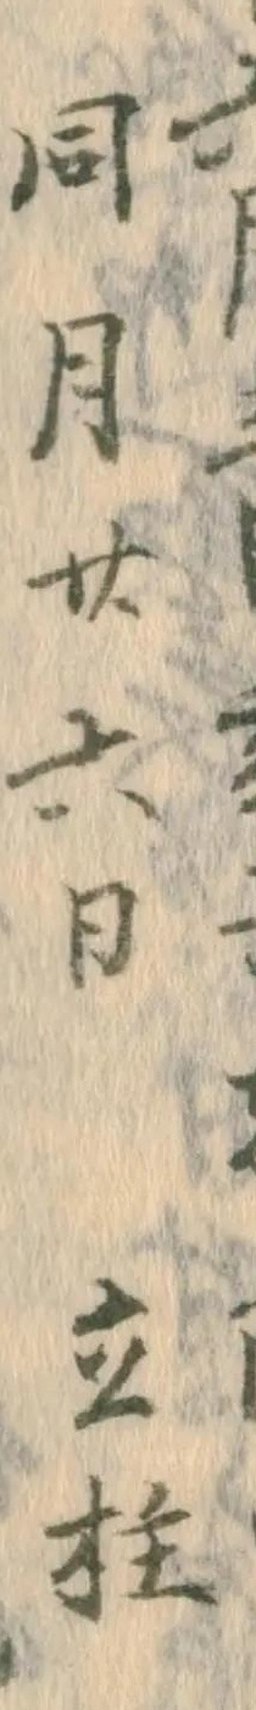同月廿六日立柱
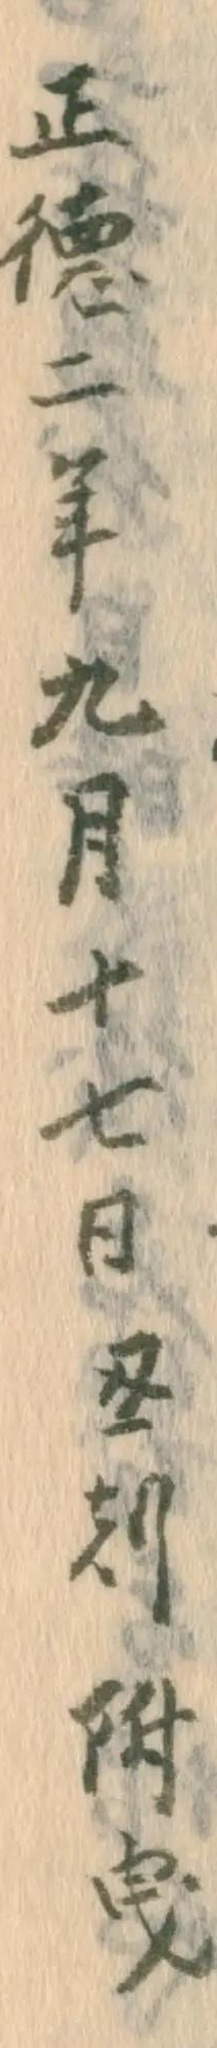正徳二年九月十七日丑刻附曳
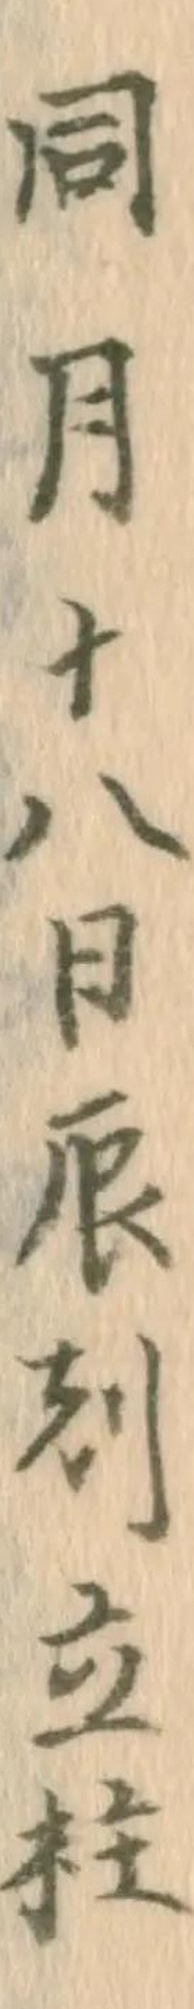同月十八日辰刻立柱
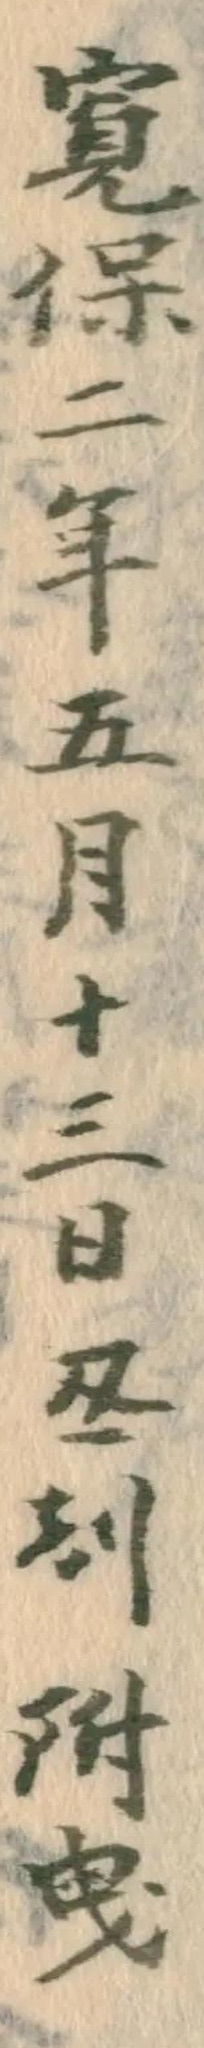寛保二年五月十三日丑刻附曳
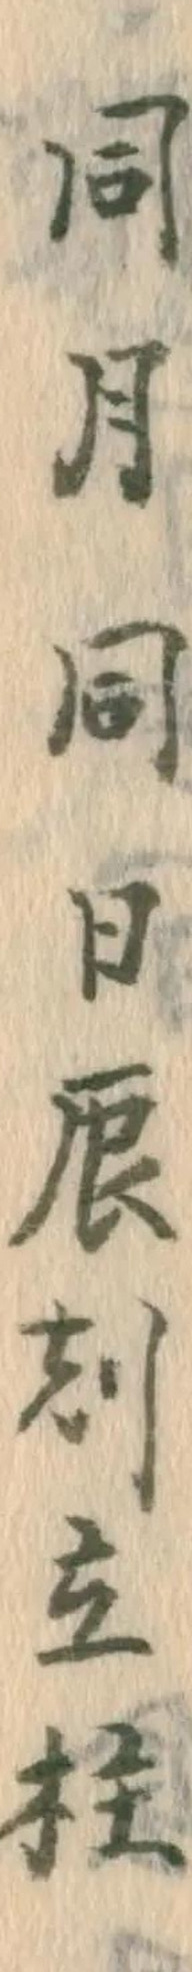同月同日辰刻立柱
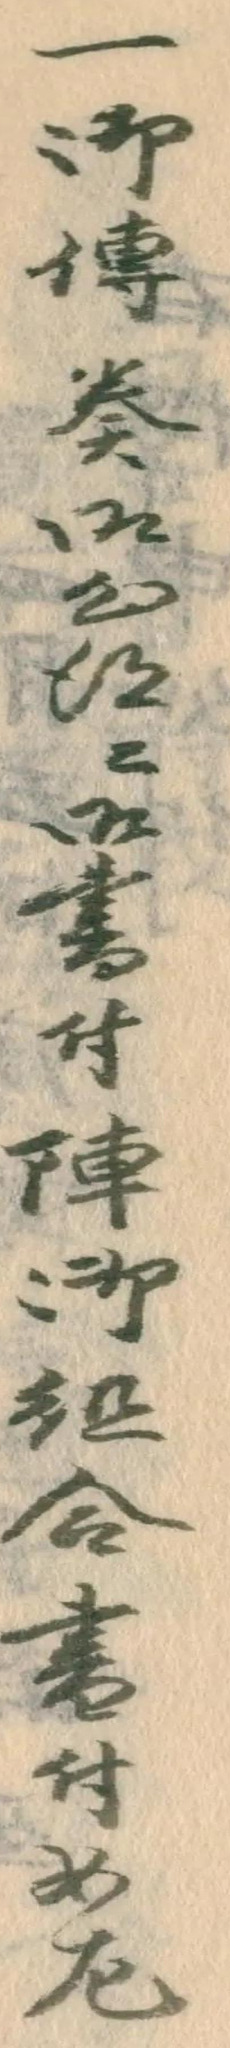一御伝奏御心得ニ御書付陣御組合書付如左
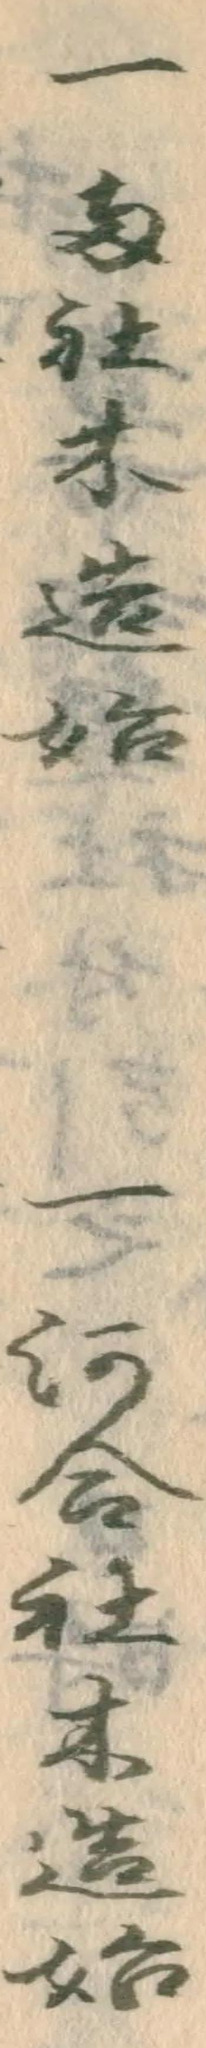一両社木造始一河合社木造始
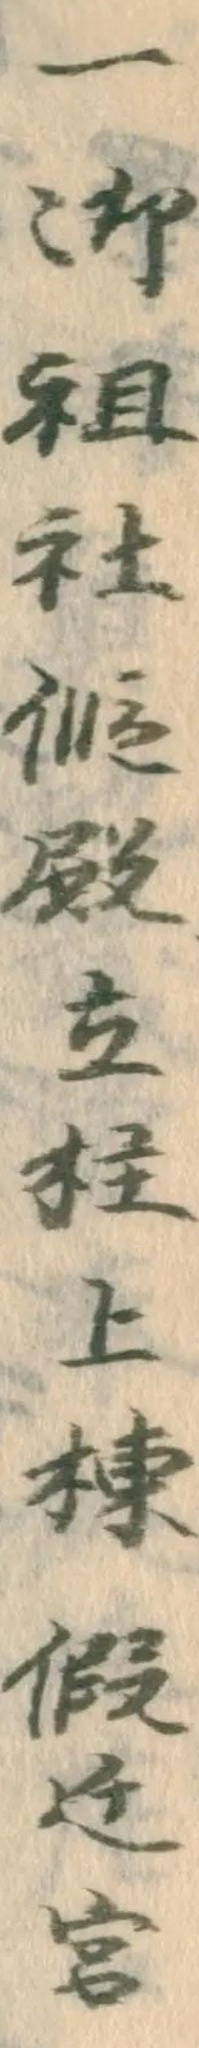一御祖社仮殿立柱上棟仮迁宮
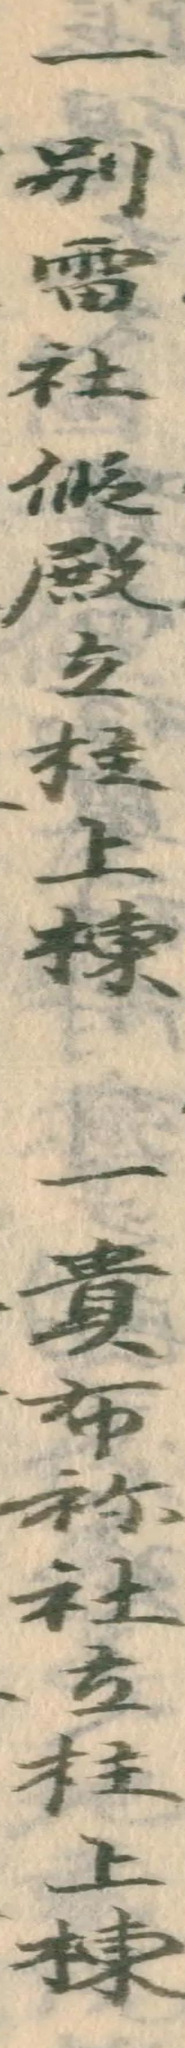一別雷社仮殿立柱上棟一貴布祢社立柱上棟
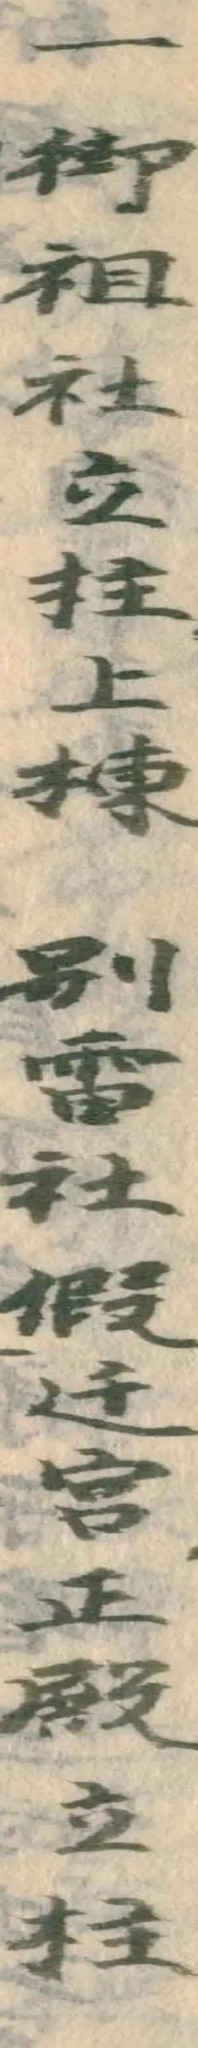一御祖社立柱上棟別雷社仮迁宮正殿立柱
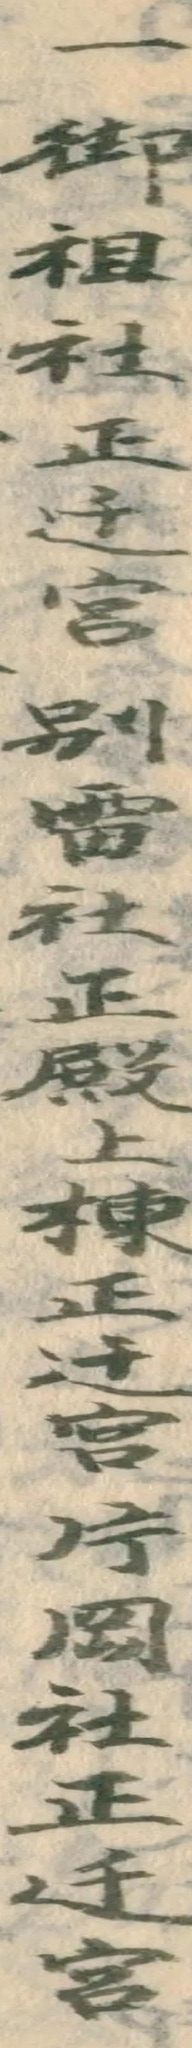一御祖社正迁宮別雷社正殿上棟正迁宮片岡社正迁宮
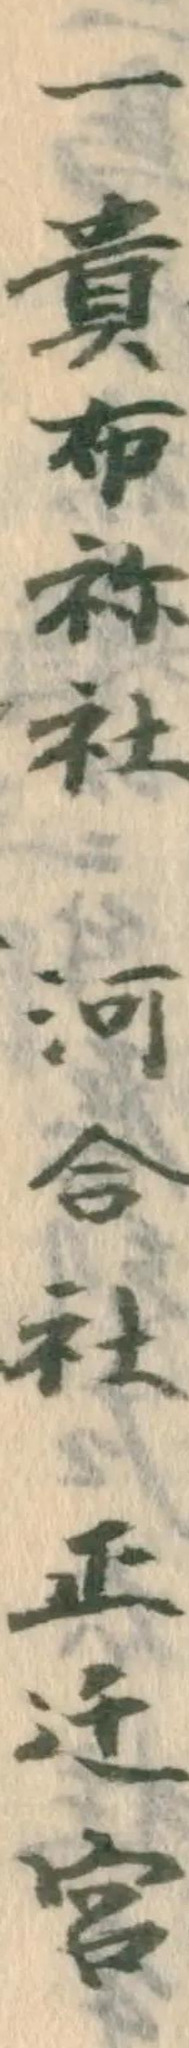一貴布祢社河合社正迁宮
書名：賀茂社記録. 第17冊
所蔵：国立国会図書館 National Diet Library, JAPAN
